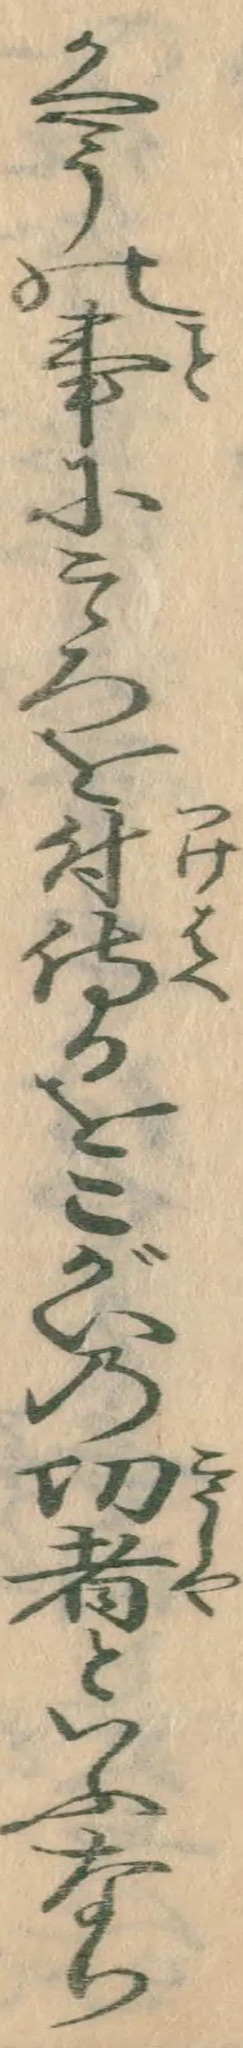かやうの事にこゝろを付侍るをこがいの功者といふなり
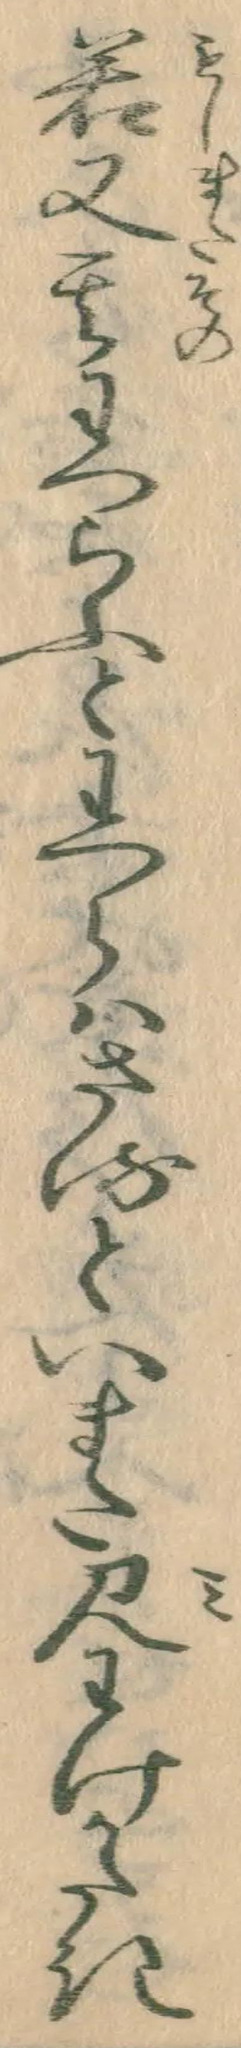若又其わつらふとわつらはさるといまた見わけかたき
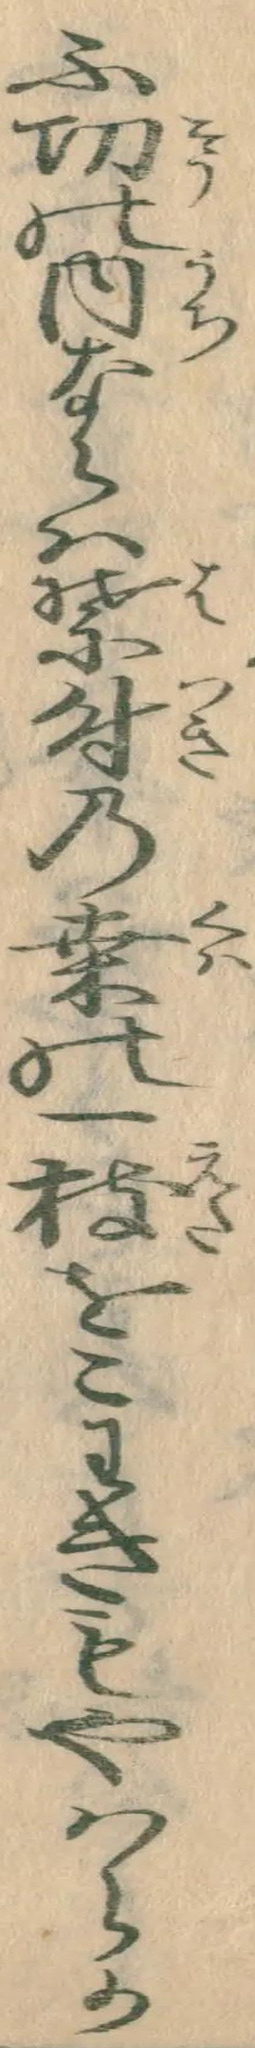ふ功の内ならは葉付の桑の一枝をこわきもやはらか
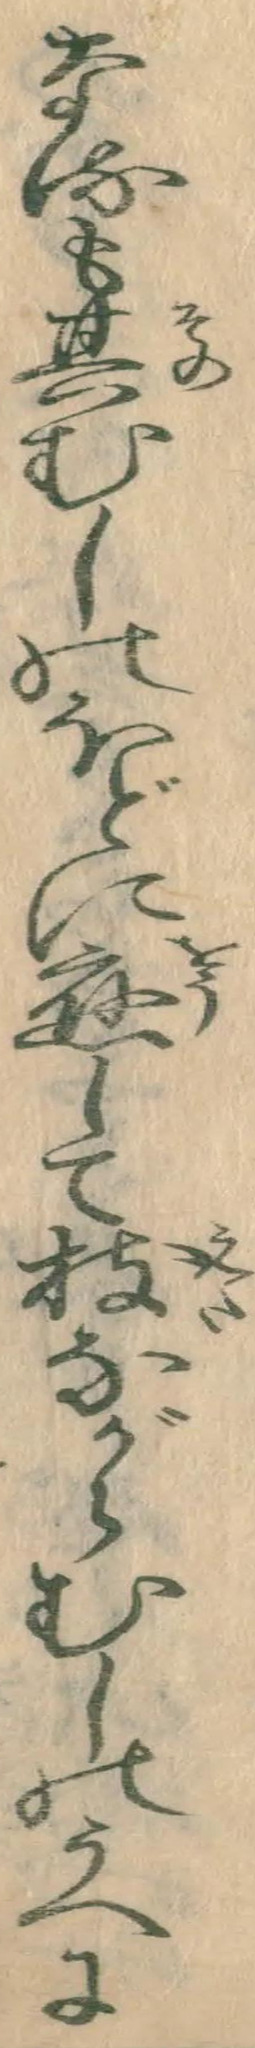なるも其むしのほどに応して枝ながらむしのうへに
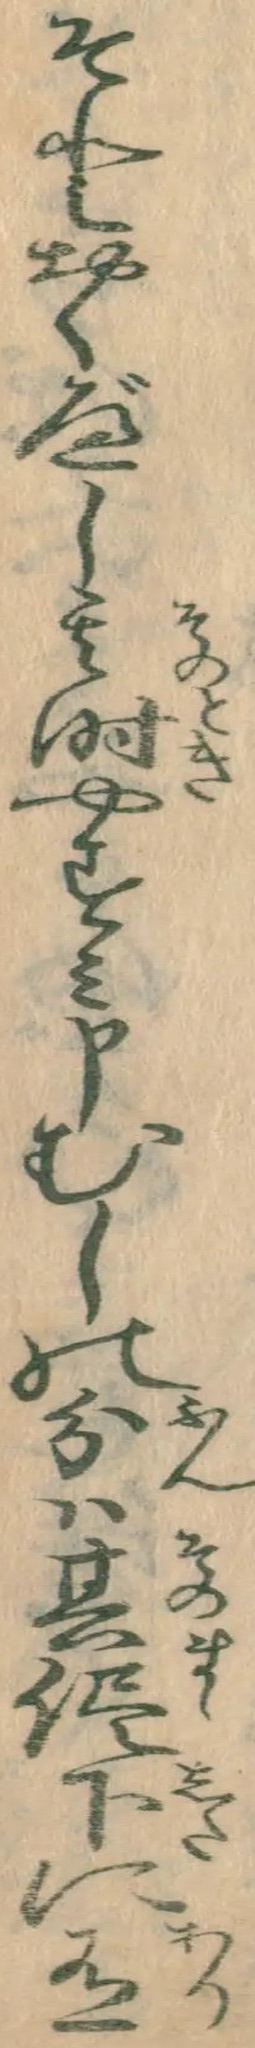そとおくべし其時やすみ申むしの分は其侭下に有

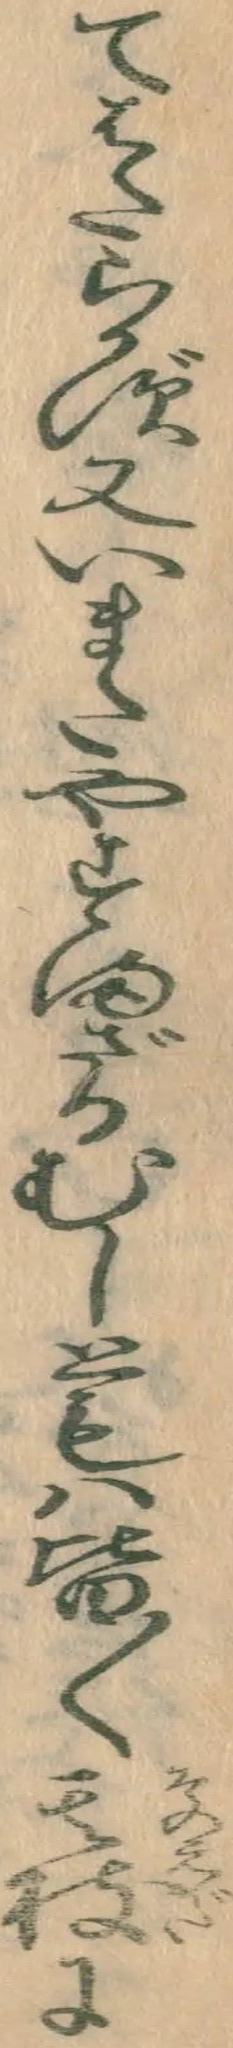てはたらかず又いまたやすまざるむしともは皆〳〵其枝に
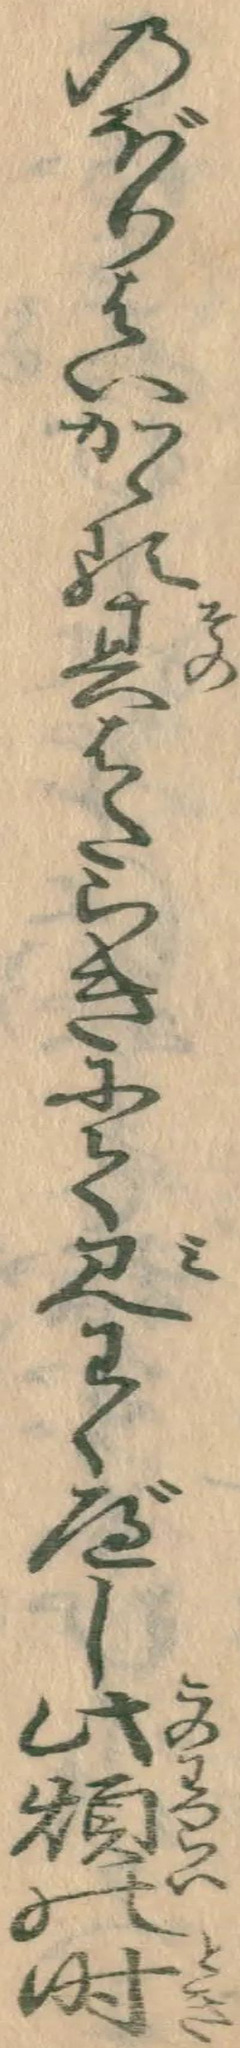のぼりはいかゝる其はたらきにて見わくべし此煩の時
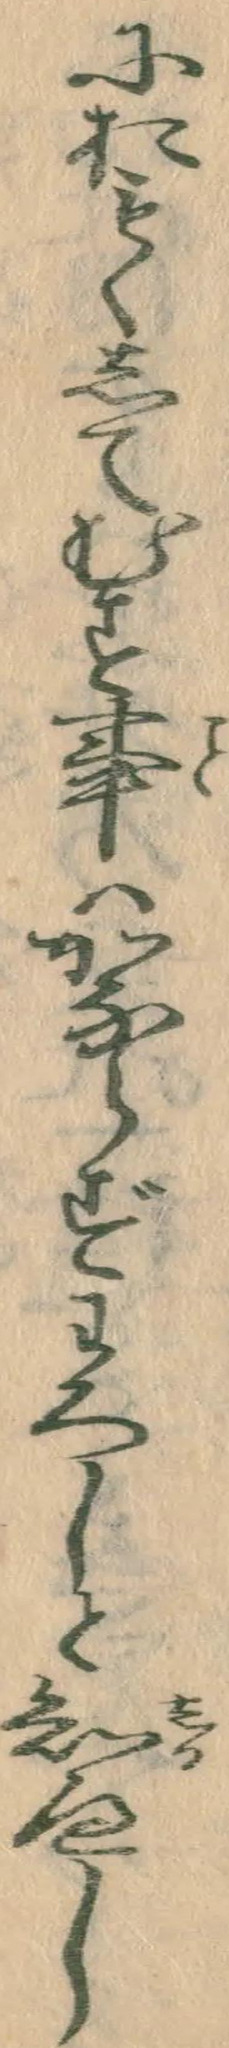におもくしてむす事はかならずわろしと知へし
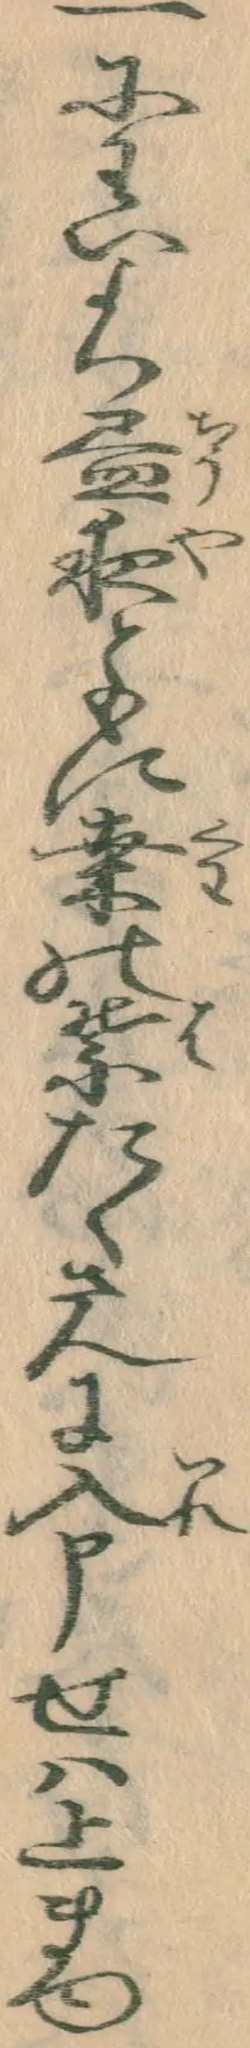一にわいより昼夜ともに桑の葉たくさんに入申せは上まゆ
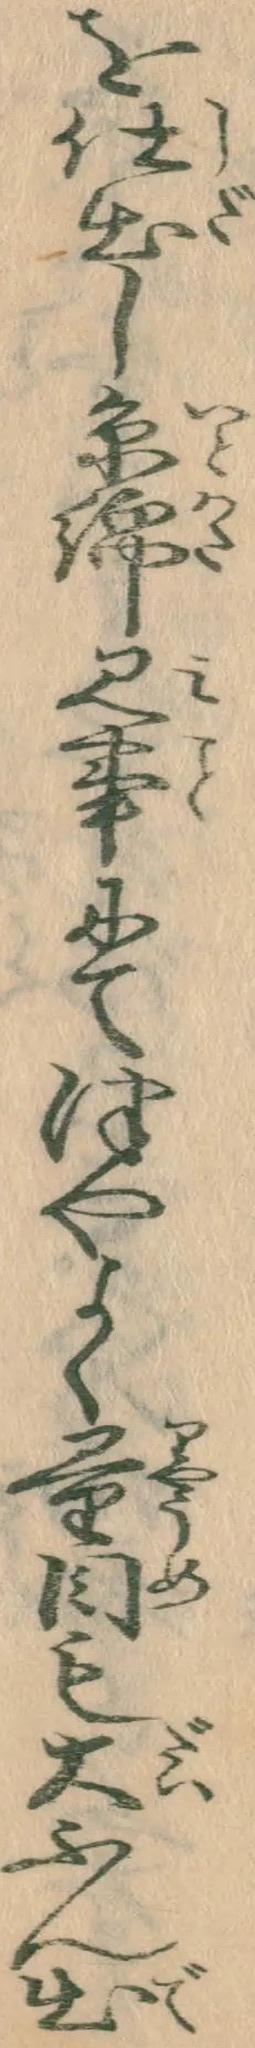を仕出し糸綿見事にてつやよく量目も大ふん出
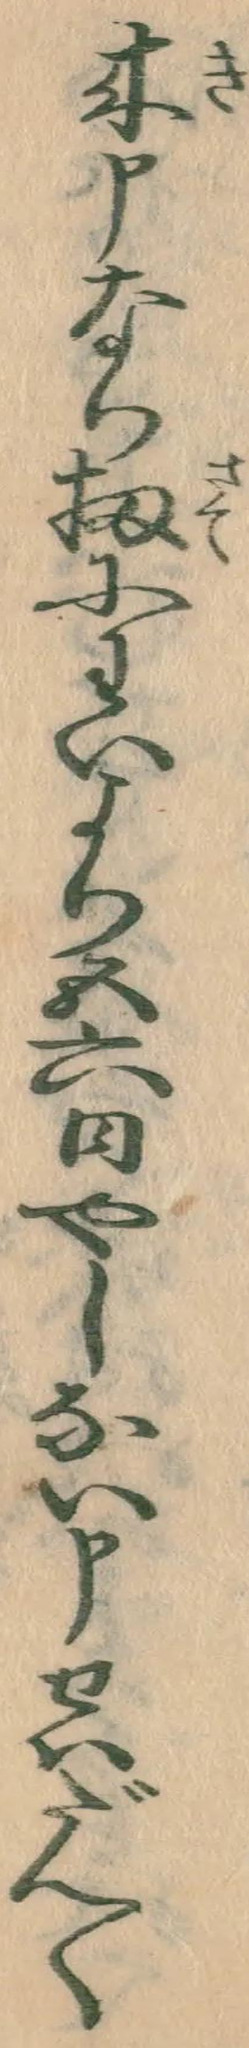来申なり扨にわいより五六日やしない申せはだん〳〵
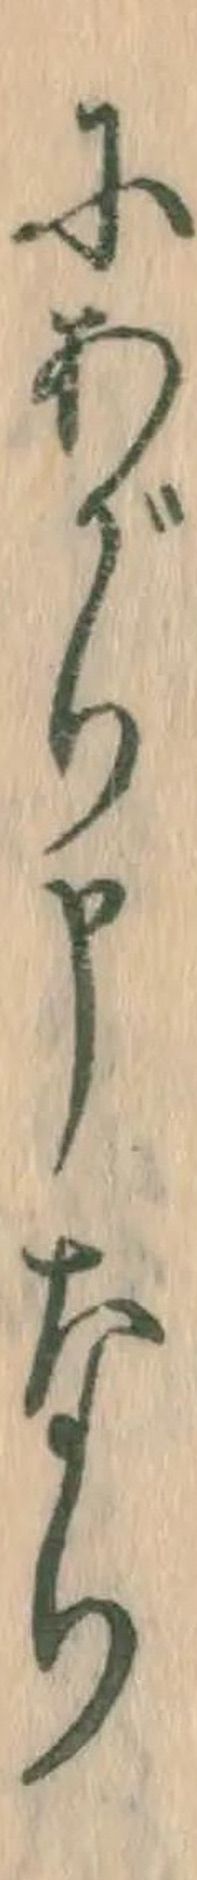にあがり申なり
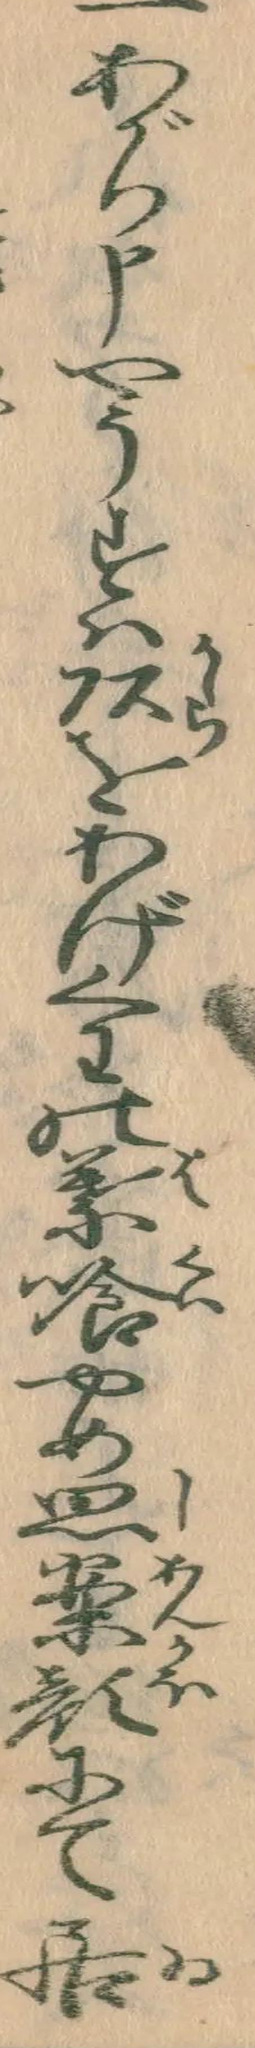一あがり申やうすは頭をあげくわの葉喰やめ思案顔にて居
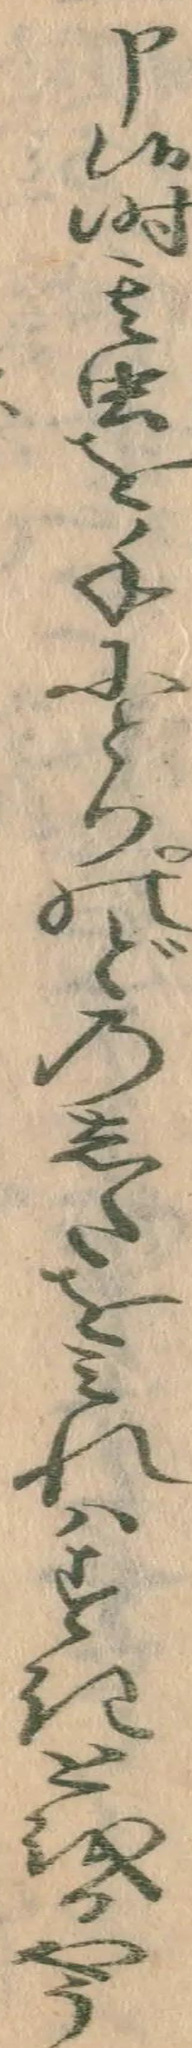申候時其虫を手にとり。のどのしたをみれはすきとをるやう
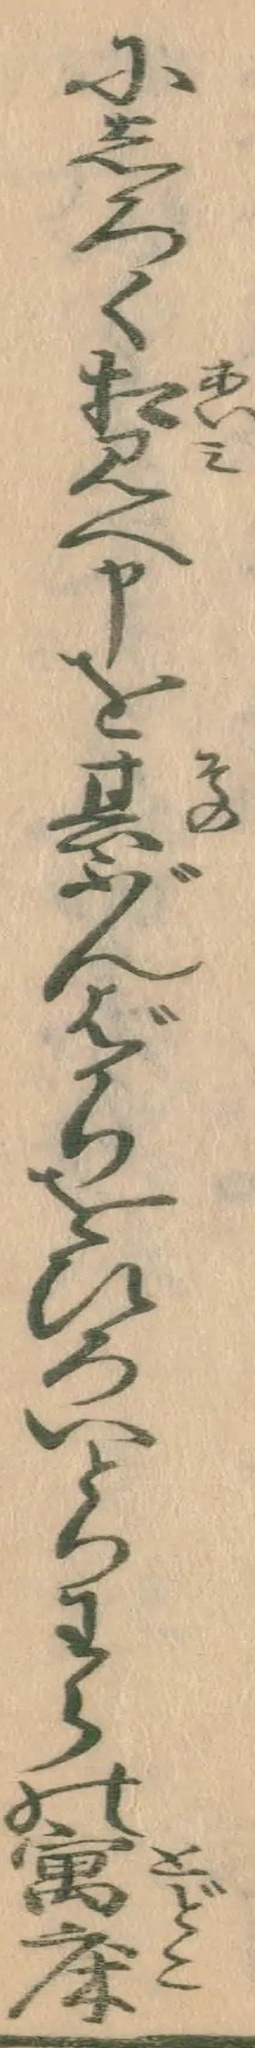にしろく相見へ申を其ぶんばかりをひろいとりわらの寓床
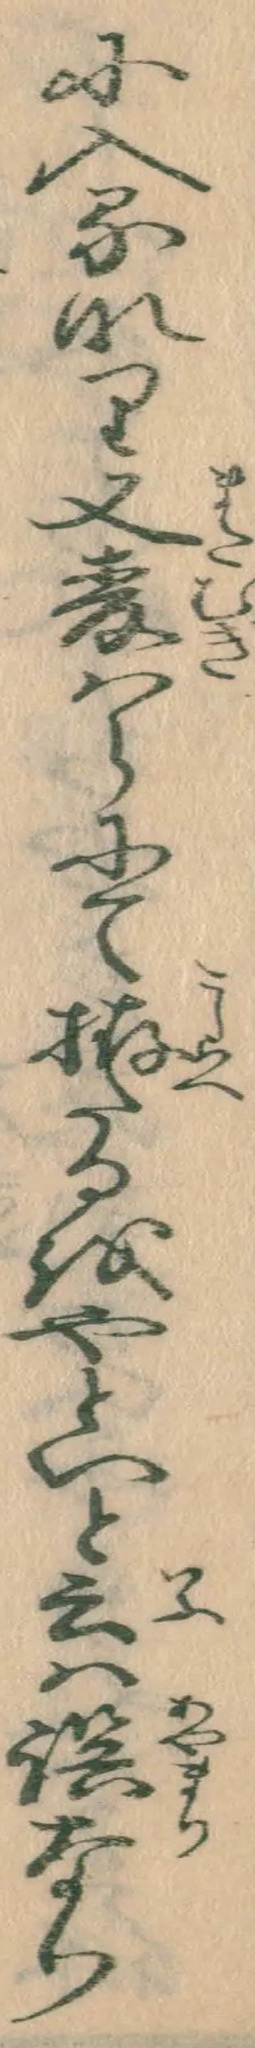に入るなり又麦はらにて拵たるをやといと云は誤なり
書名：蚕飼養法記
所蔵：国立国会図書館 National Diet Library, JAPAN
